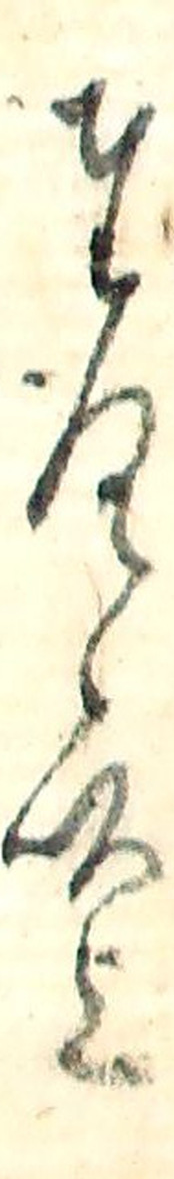奉存候以上

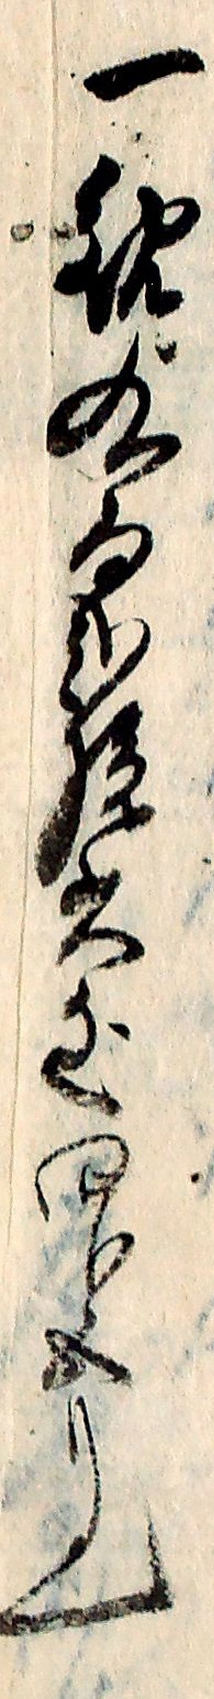一銀九百弐拾六匁四分五りん
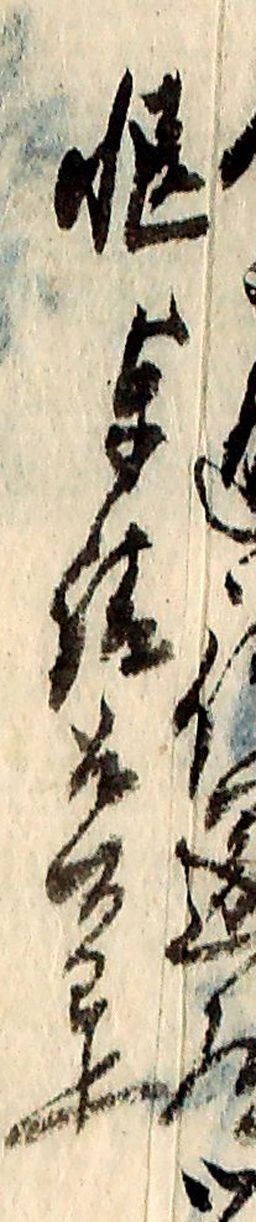慥奉請取候已上
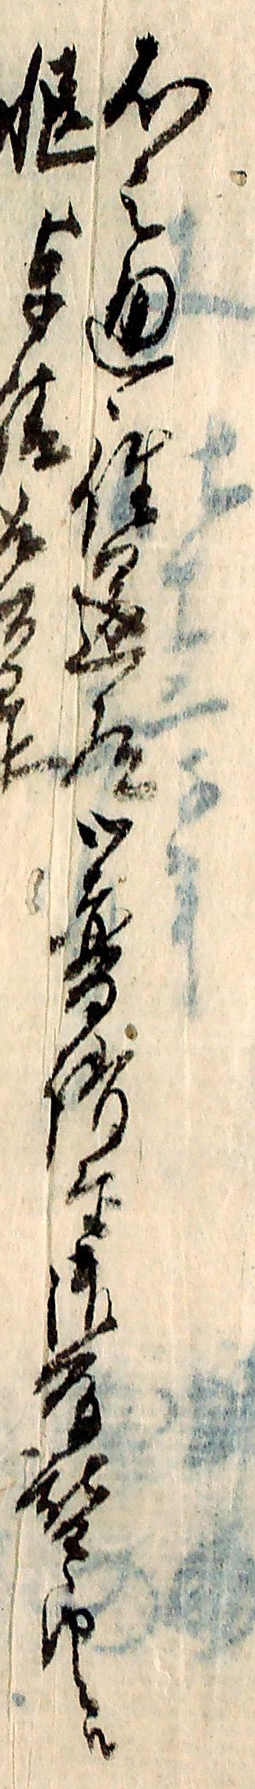右之通往還道御普請金御立替之内に候
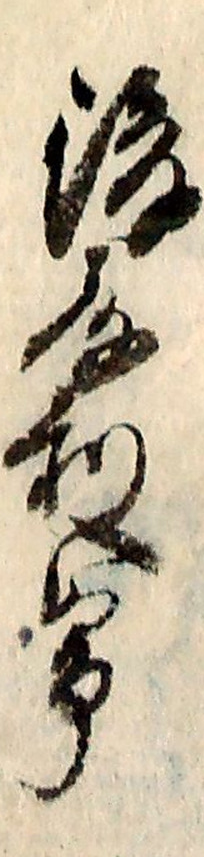後藤利八郎
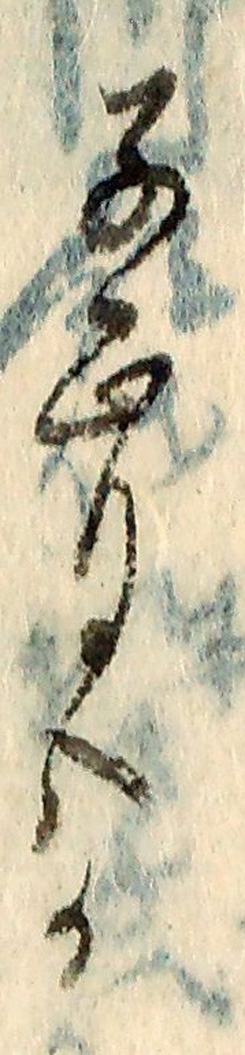子正月八日
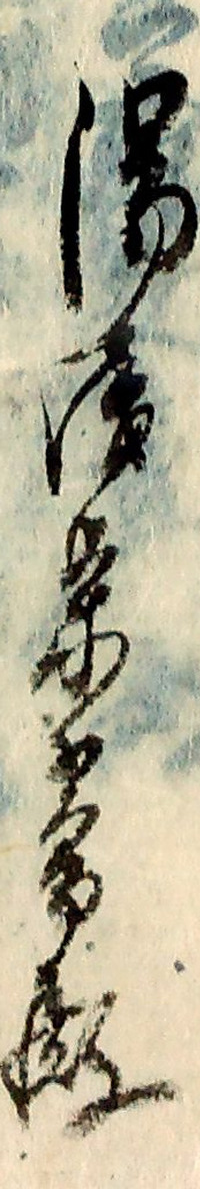湯浅粂五郎殿
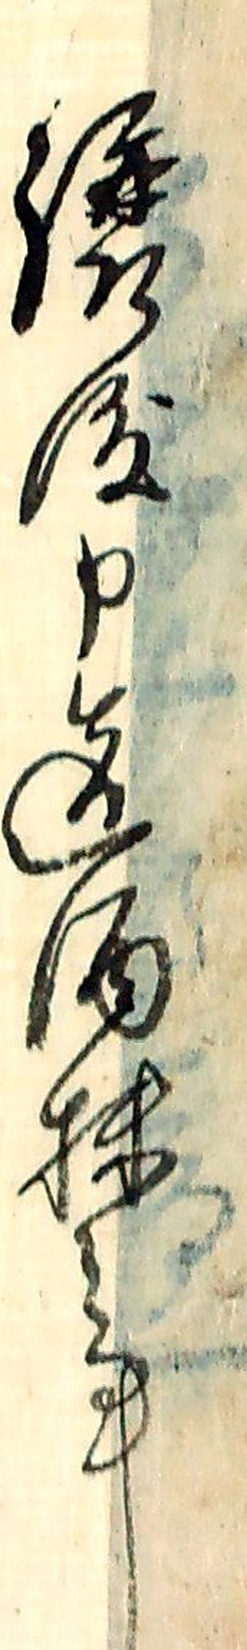譲渡申造酒株之事
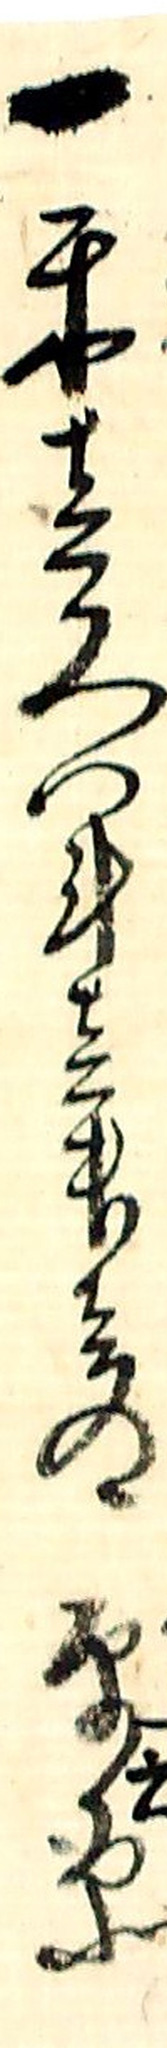一米壱石八斗壱升壱合平六兵衛
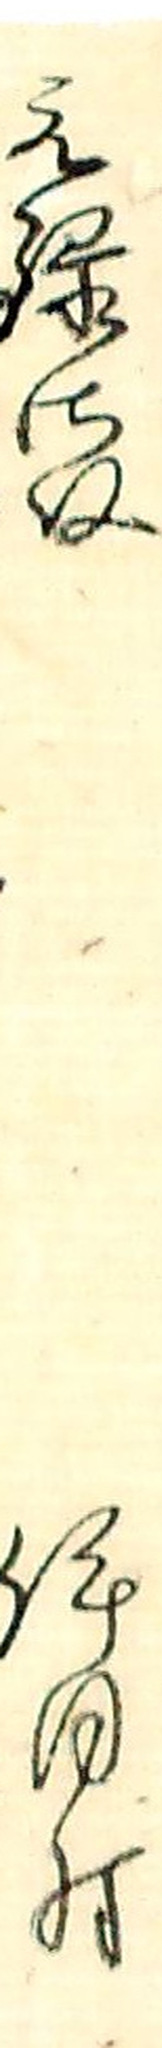元禄御改伊月村
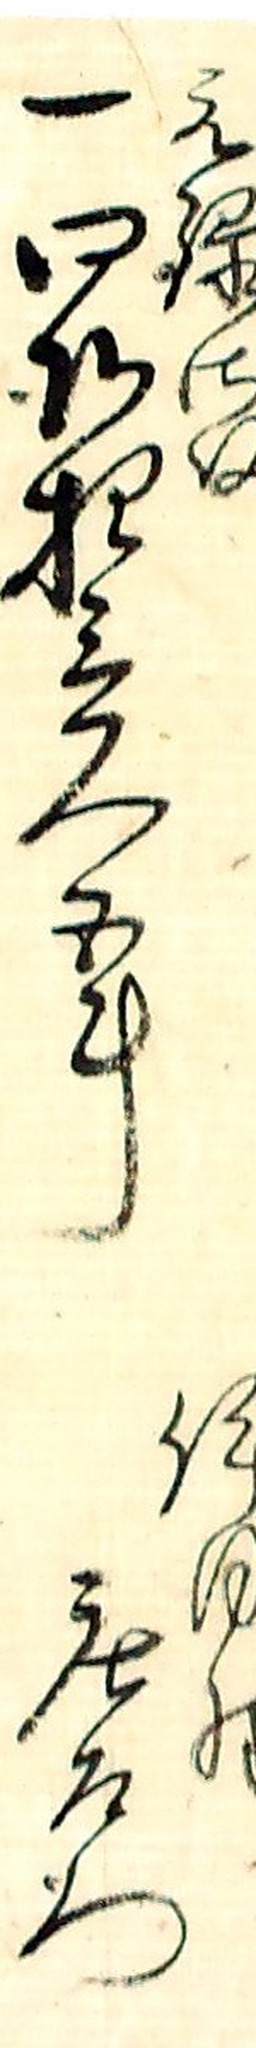一同弐拾三石五斗庄左衛門
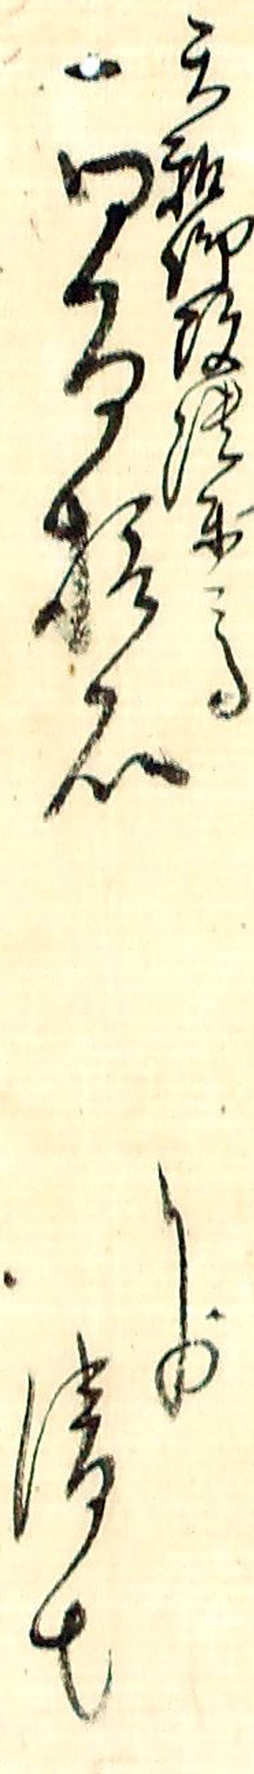一同百拾石清七
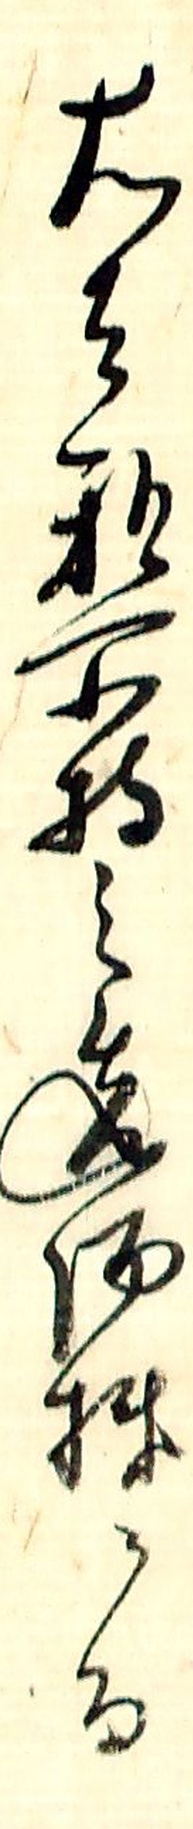右は私所持之造酒株にて
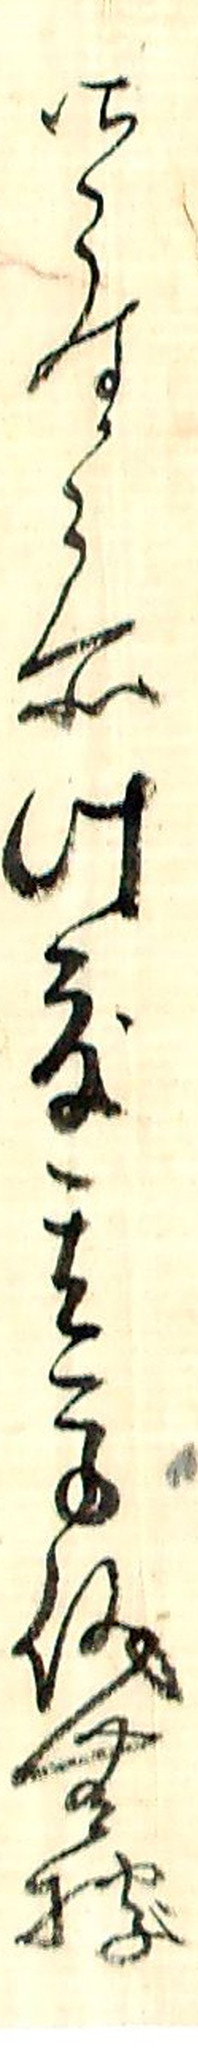御座候所此度其方儀無拠
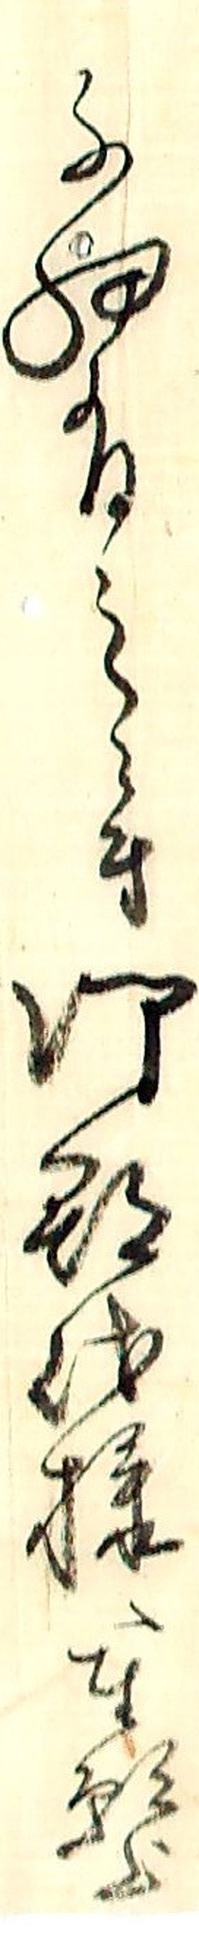子細有之に付御郡代様へ奉願上
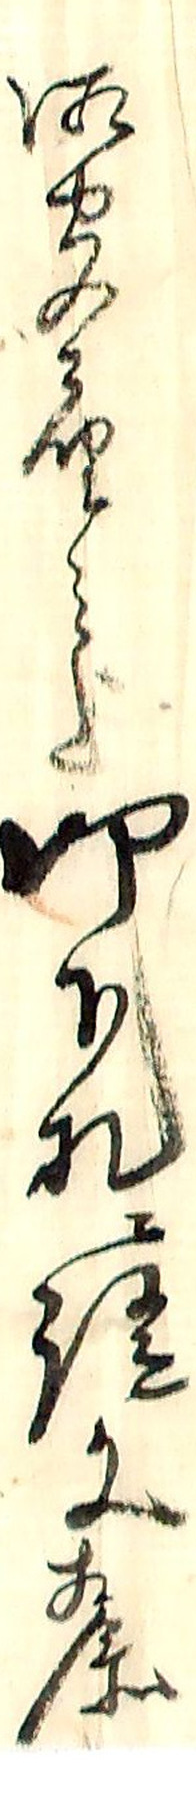御聞届之上御下札に証文相添
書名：諸御願書控(後藤氏壱番）
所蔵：鳴門教育大学 Naruto University of Education
